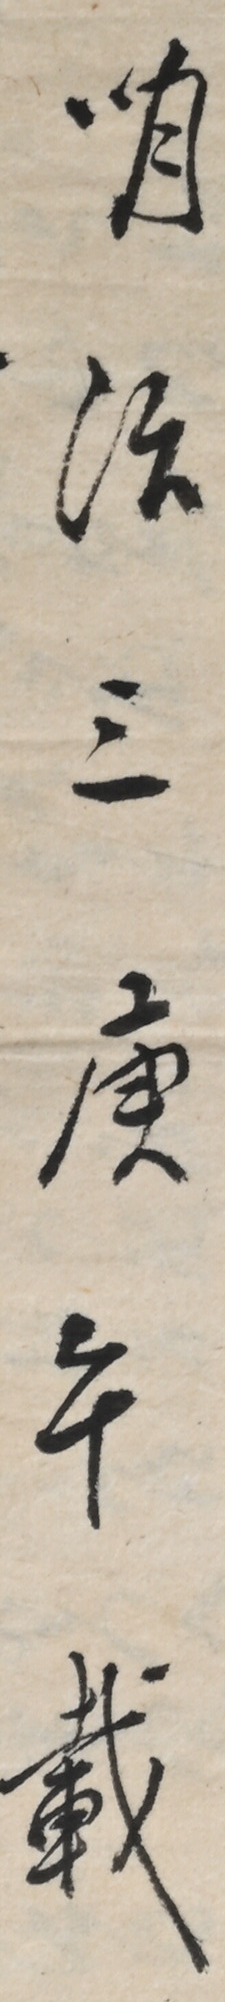明治三庚午載
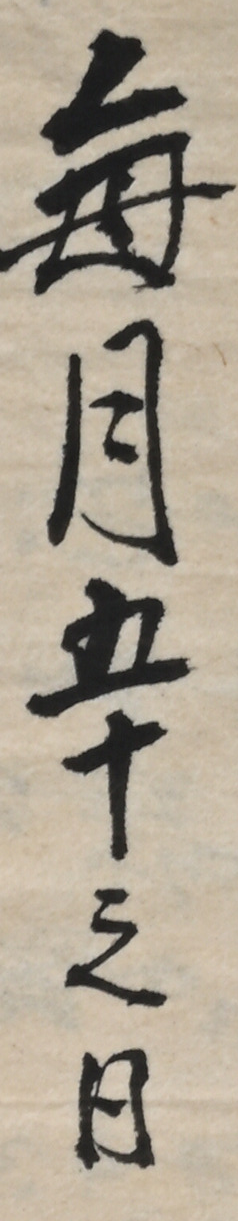毎月五十之日
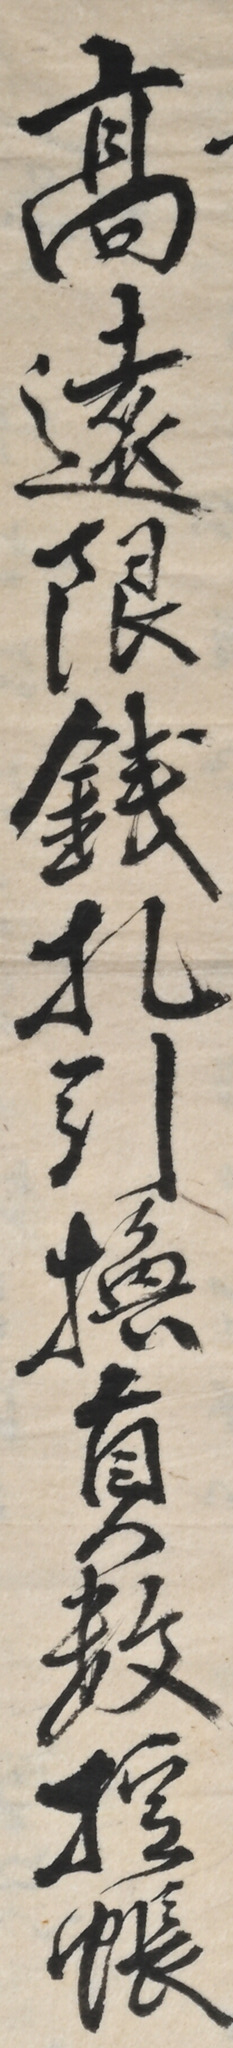高遠限銭札引換員数控帳
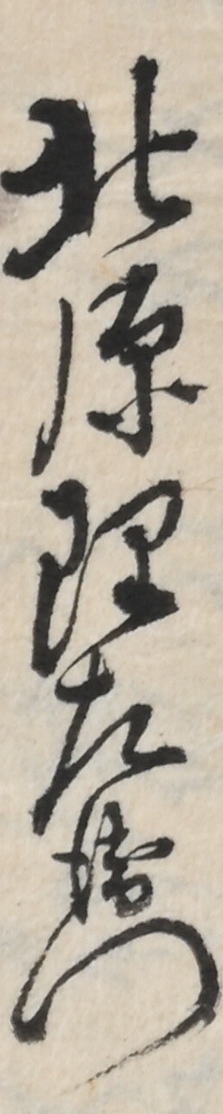北原理左衛門
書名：毎月五十之日髙遠限銭札引換員数控帳
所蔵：伊那市立高遠町図書館・合同会社AMANE
